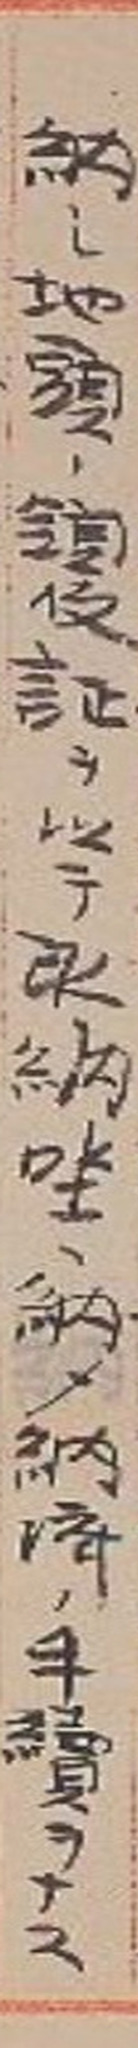納シ地頭ノ領収証ヲ以テ取納坐ヘ納メ納済ノ手続ヲナス
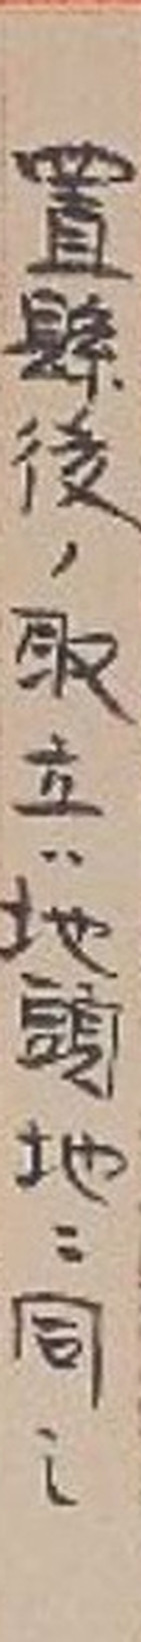置県後ノ取立ハ地頭地ニ同シ
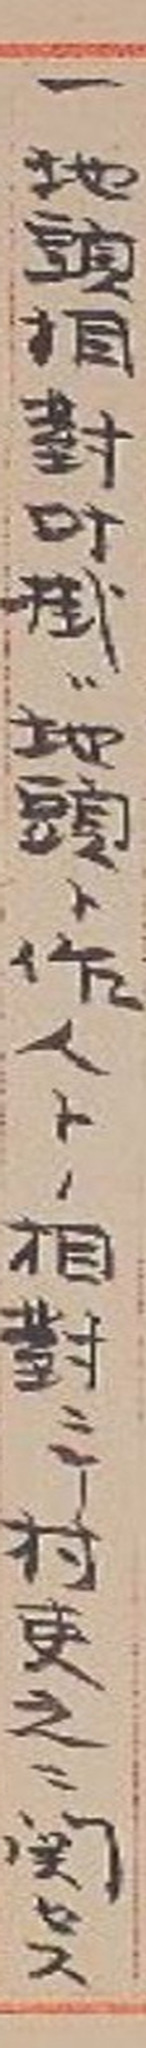一地頭相対叶掛ハ地頭ト作人トノ相対ニテ村吏之ニ関セス
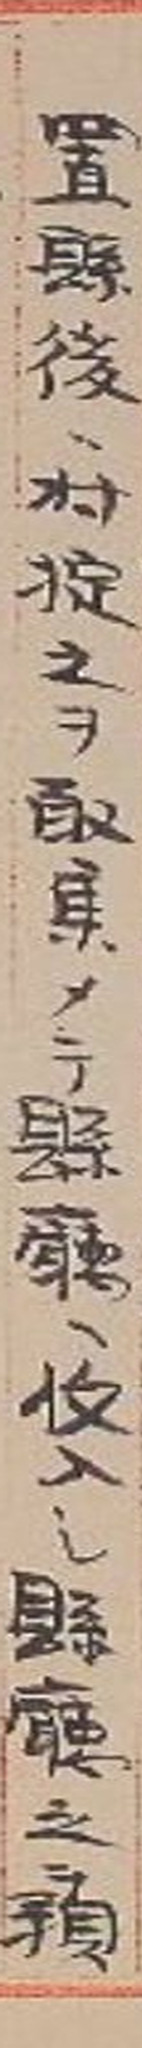置県後ハ村掟之ヲ取集メテ県庁ヘ収入シ県庁之ヲ預
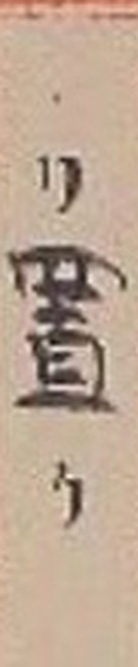リ置ク
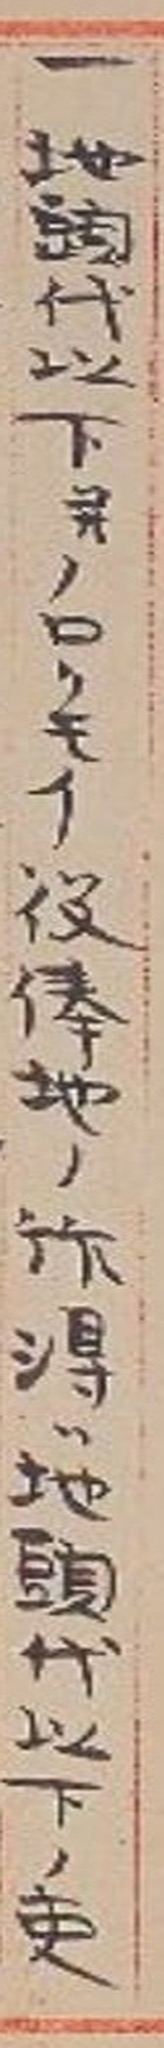一地頭代以下并ノロクモイ役俸地ノ作得ハ地頭代以下ノ吏
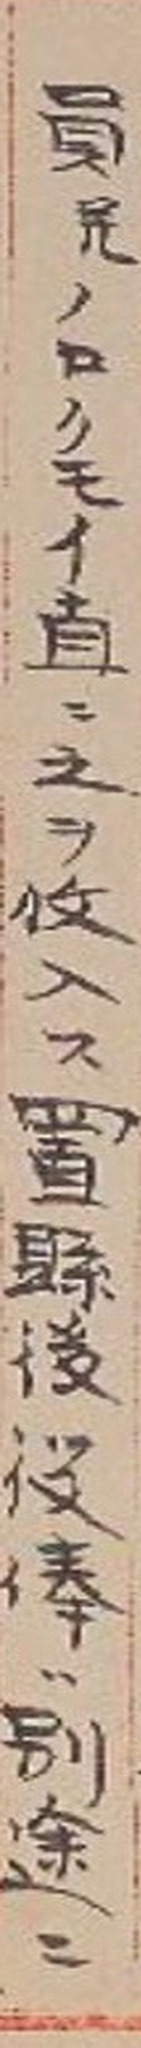員并ノロクモイ直ニ之ヲ収入ス置県後役俸ハ別途ニ
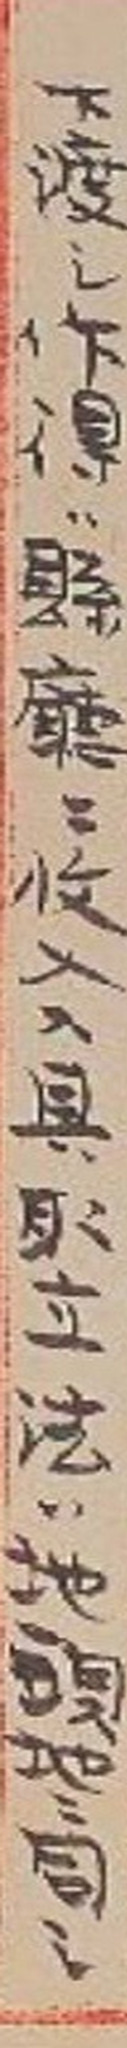下渡シ作得ハ県庁ニ収入ス其取立法ハ地頭地ニ同シ
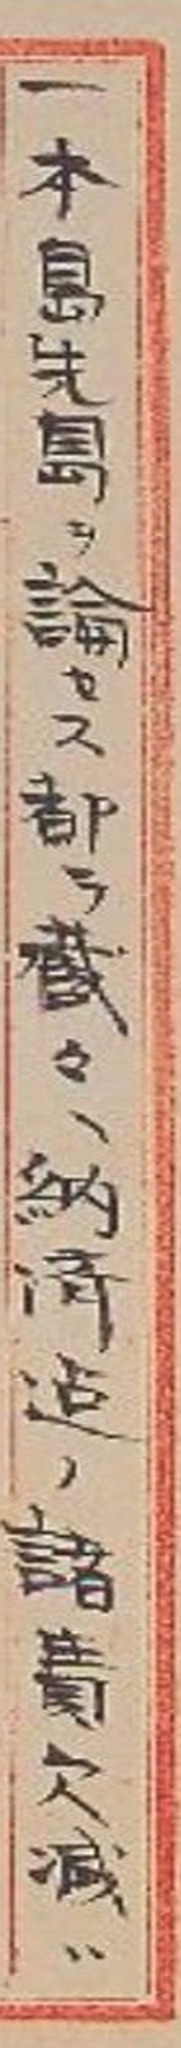一本島先島ヲ論セス都テ蔵々ヘ納済迄ノ諸費欠減ハ
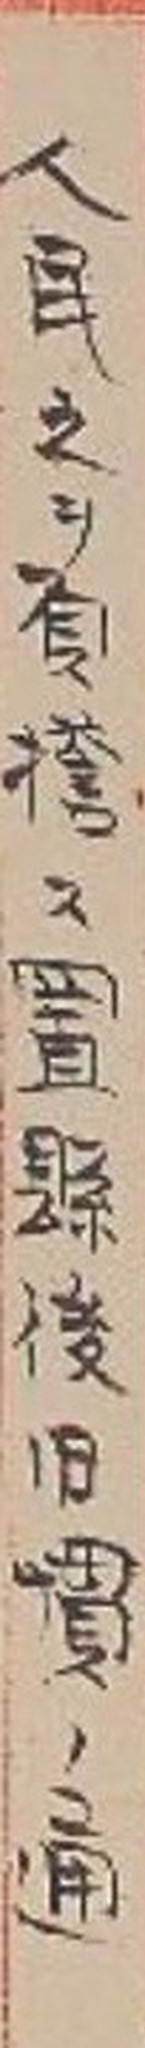人民之ヲ負担ス置県後旧慣ノ通
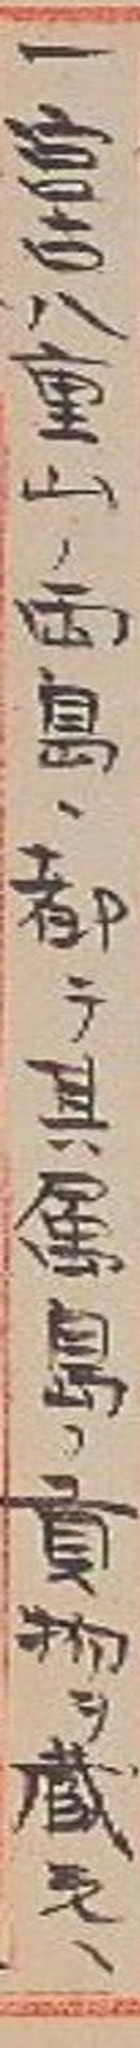一宮古八重山ノ両島ハ都テ其属島ノ貢物ヲ蔵元ヘ
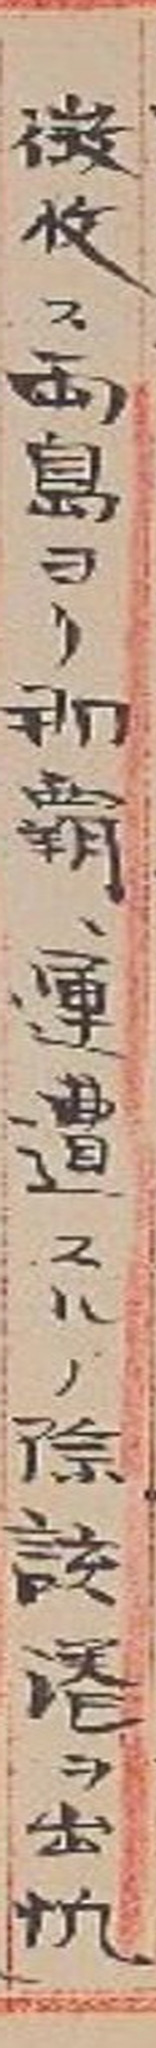徴収ス両島ヨリ那覇ヘ運遭スルノ際該港ヲ出帆
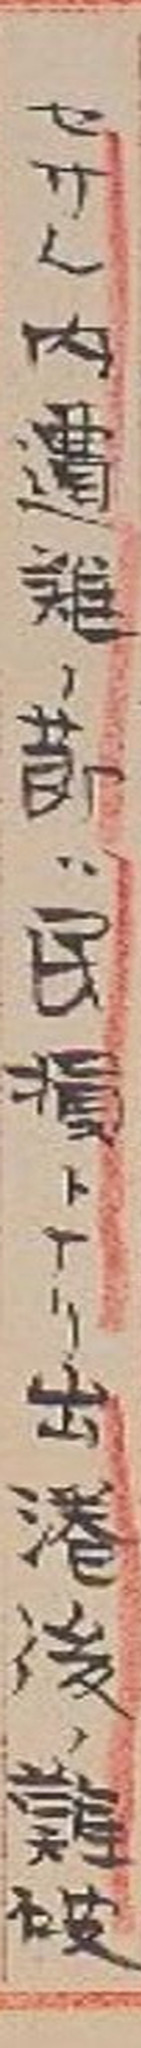セサル内遭難ノ節ハ民損トナリ出港後ノ難破
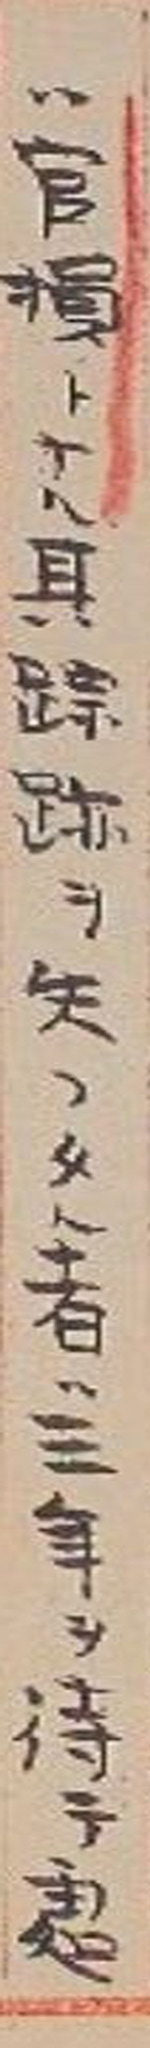ハ官損トナル其踪跡ヲ失フタル者ハ三年ヲ待テ処
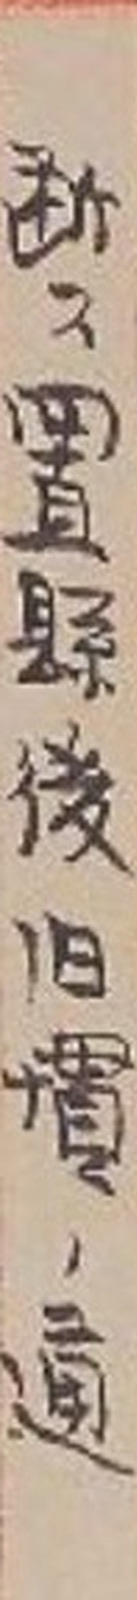断ス置県後旧慣ノ通
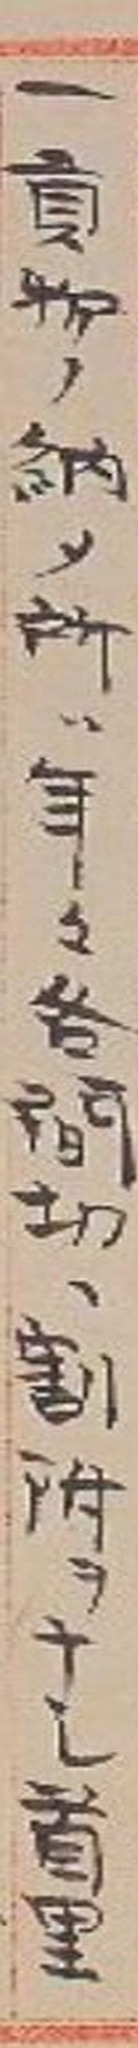一貢物ノ納メ所ハ年々各間切ヘ割附ヲナシ首里
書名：貢納物品領収旧藩慣例並ニ置県後取扱順序
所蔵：University of the Ryukyus Library
